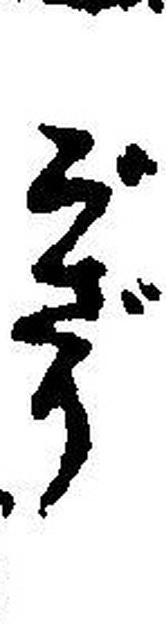ござり
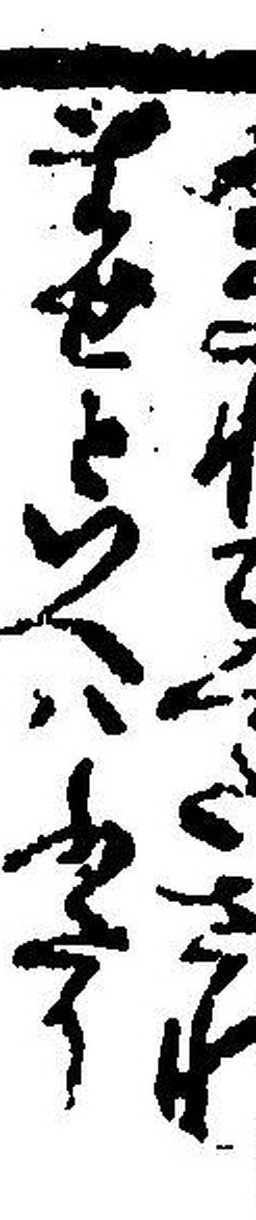ませといへはふたり
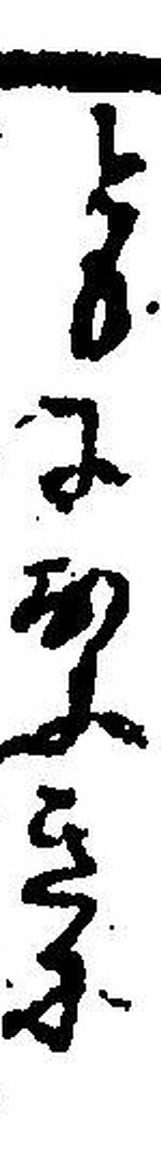ともにおふきに
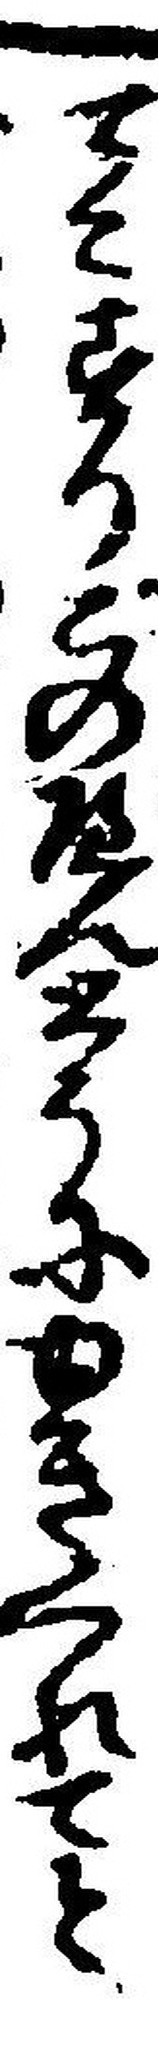てこすりこのへんへんとうにゆきくれてと
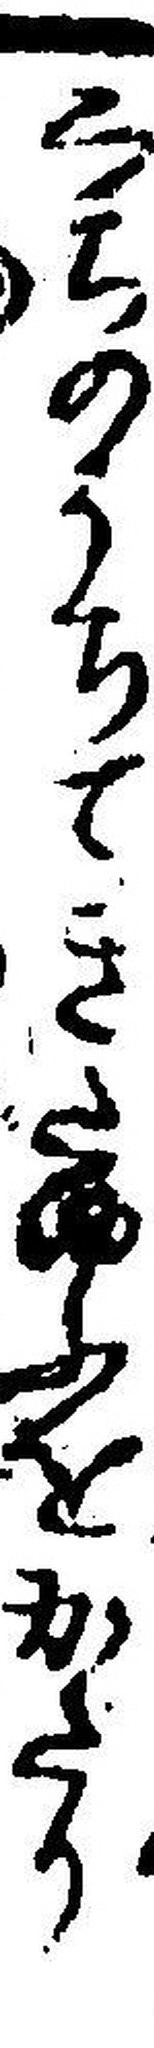くちのうちてきたゆふをかたり
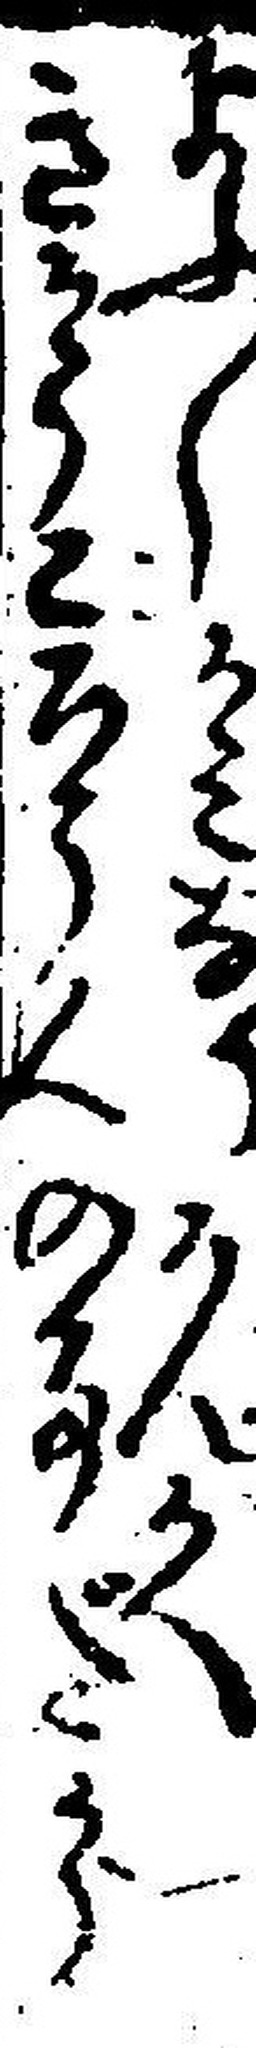きかうころう人の事だから
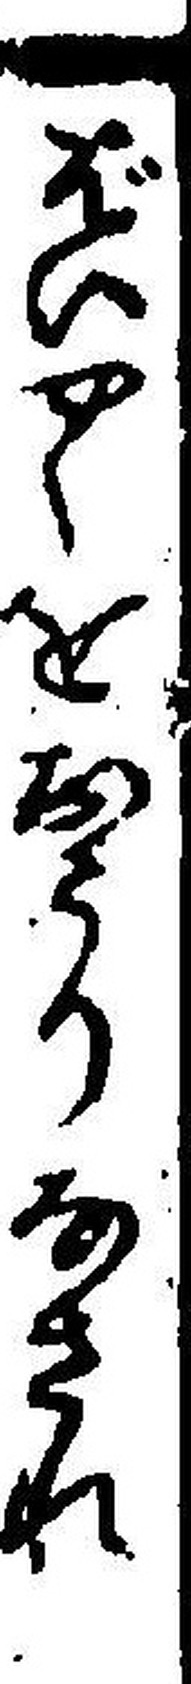ばいやくをおうりなされ
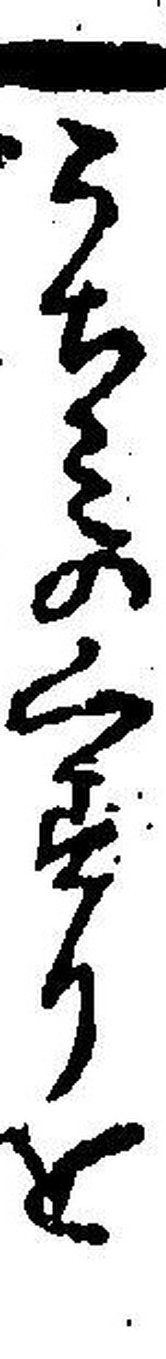うちみのくすりを
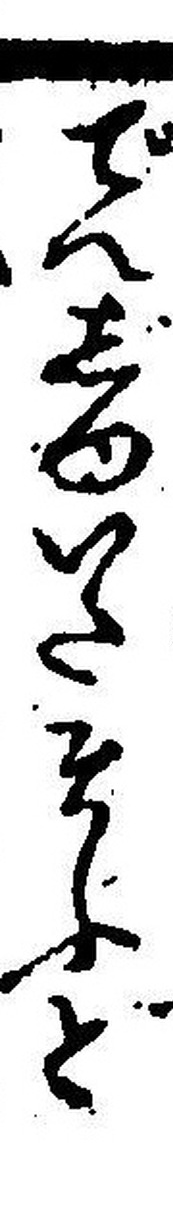でんじゆいたそふと
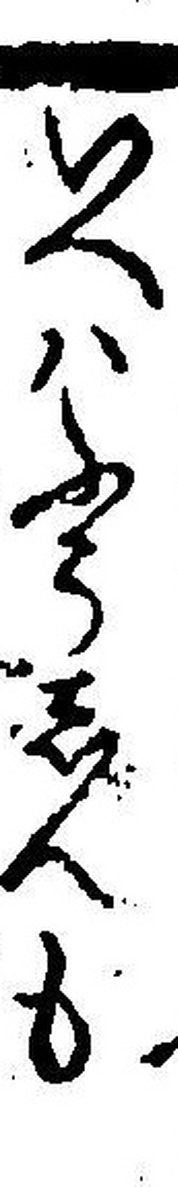いへはふうしんも
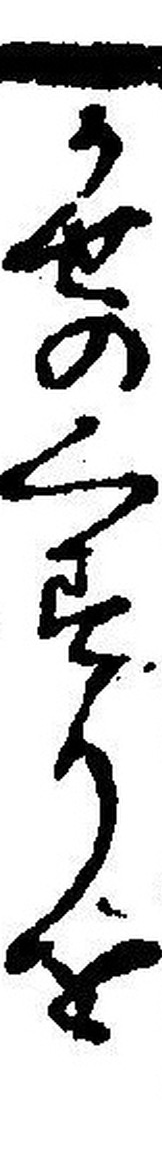かせのくすりを
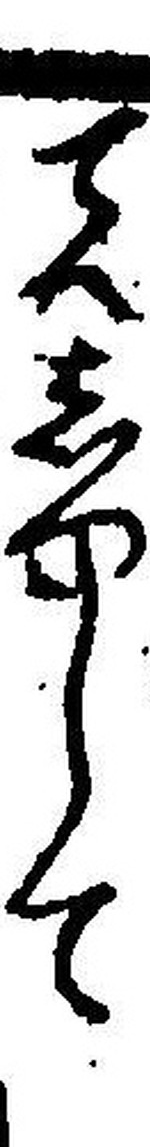てんしゆして
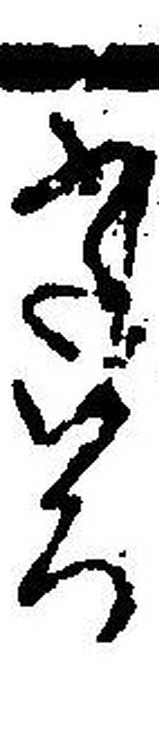ふたいろ
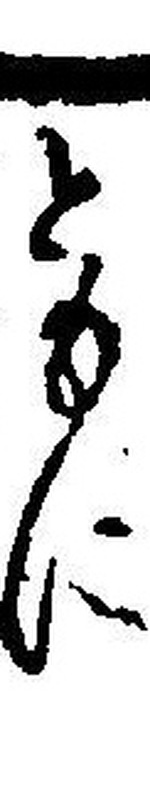ともに
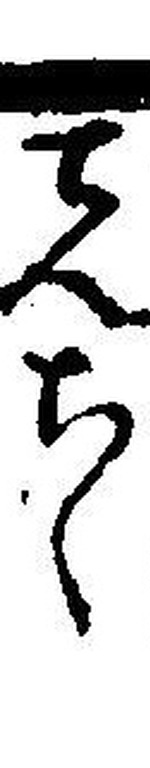てんちく
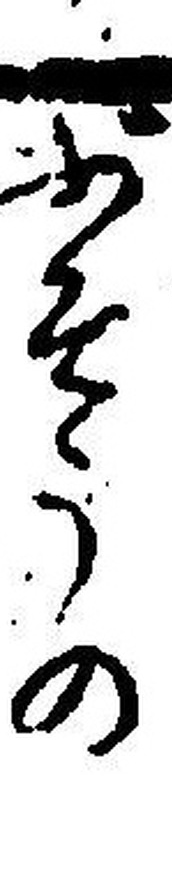ぶそうの
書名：牡丹餅棚有 / 市場通笑作
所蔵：東京大学総合図書館 General Library in the University of Tokyo, JAPAN
